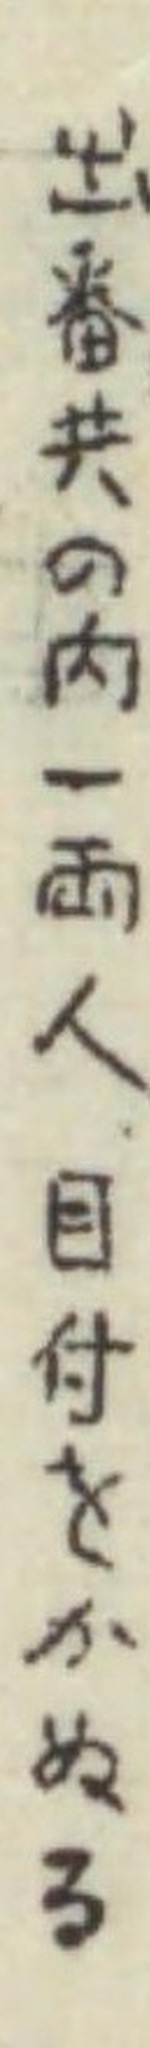出番共の内一両人目付をかぬる
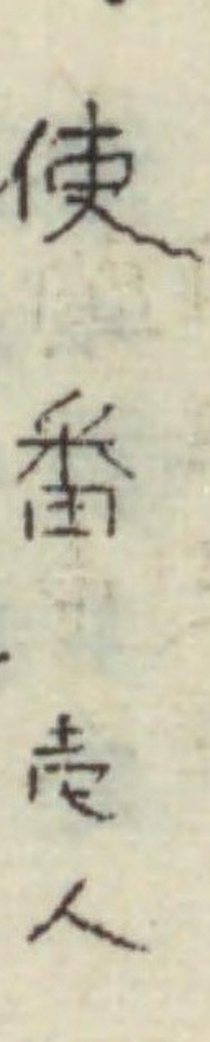使番壱人
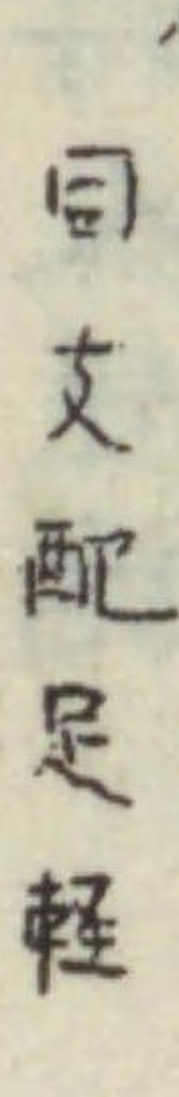鉄炮同支配足軽
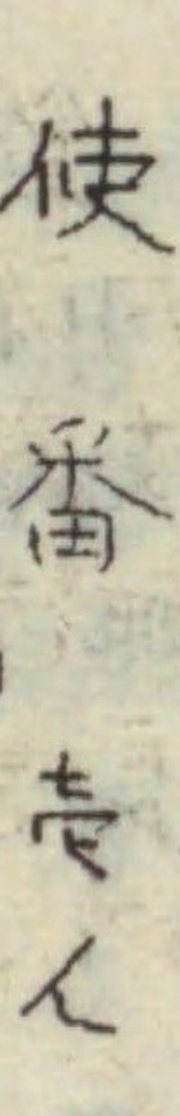使番壱人
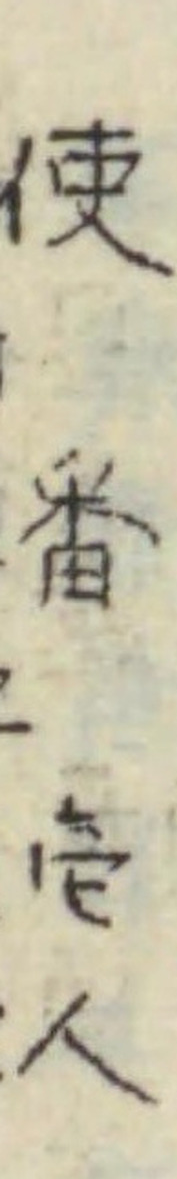使番壱人
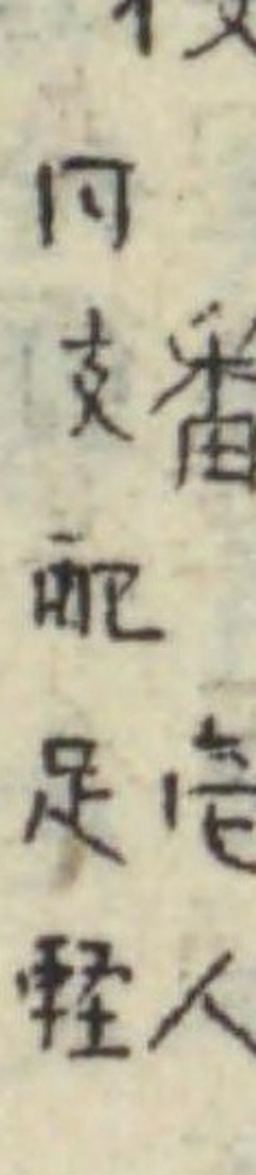鉄炮同支配足軽
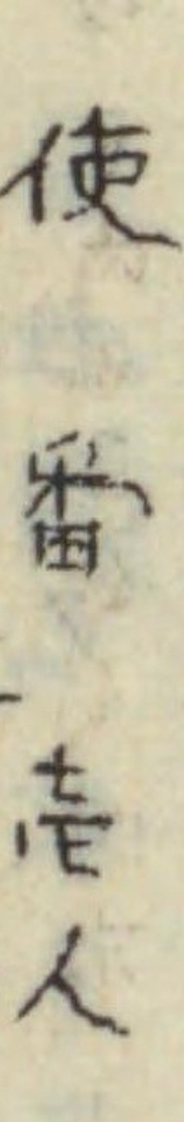使番壱人
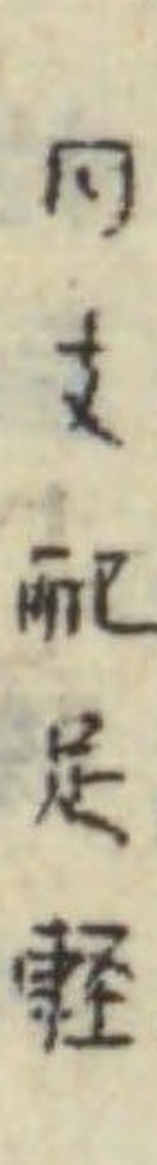鉄炮同支配足軽
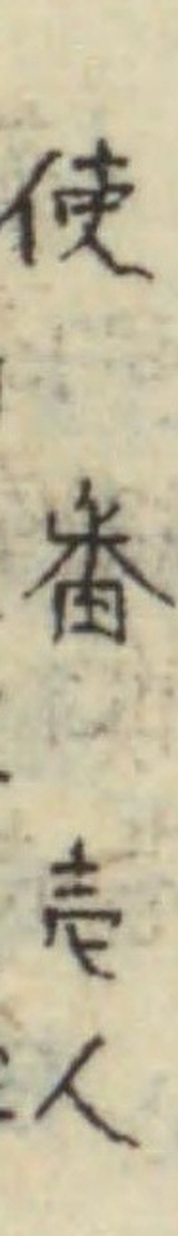使番壱人
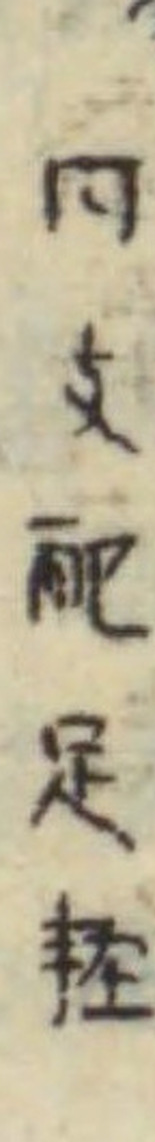鉄炮同支配足軽

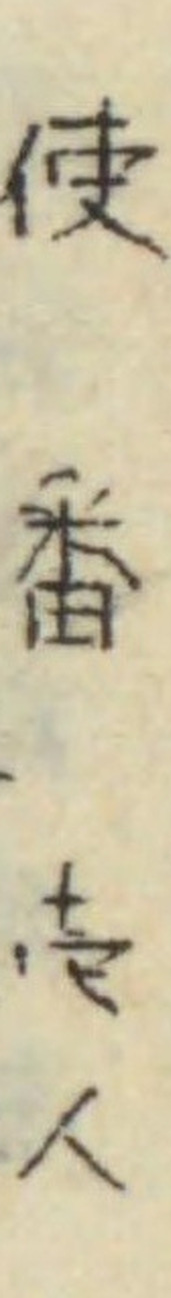使番壱人
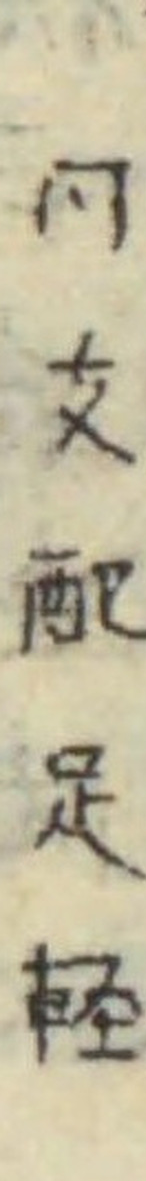同支配足軽
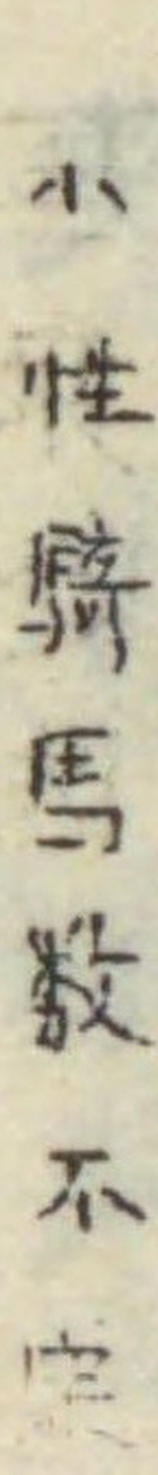小姓騎馬数不定
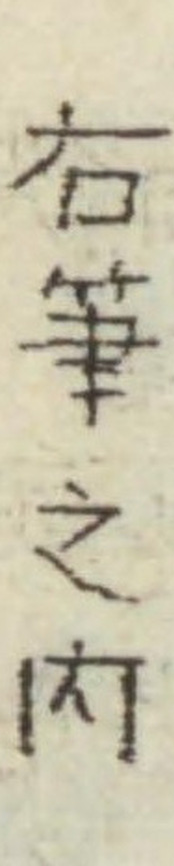右筆之内
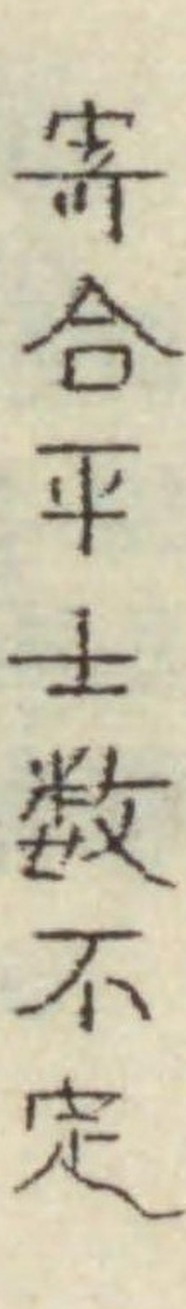寄合平士数不定
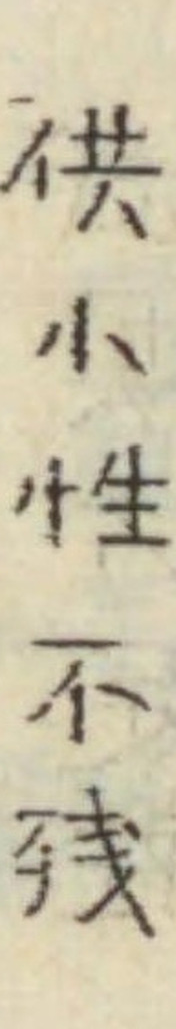供小姓不残
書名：三河吉田藩動員史料
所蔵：国立国会図書館 National Diet Library, JAPAN
